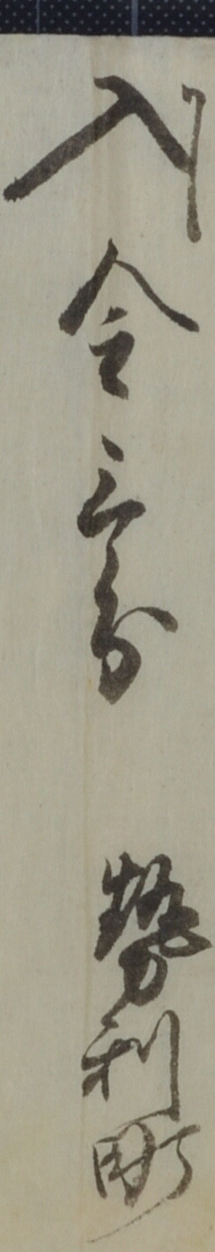入金三分勢利町
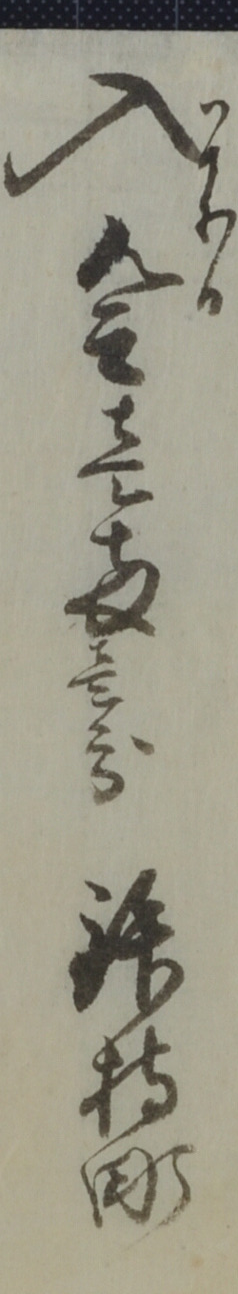入金壱両壱分鉾持町
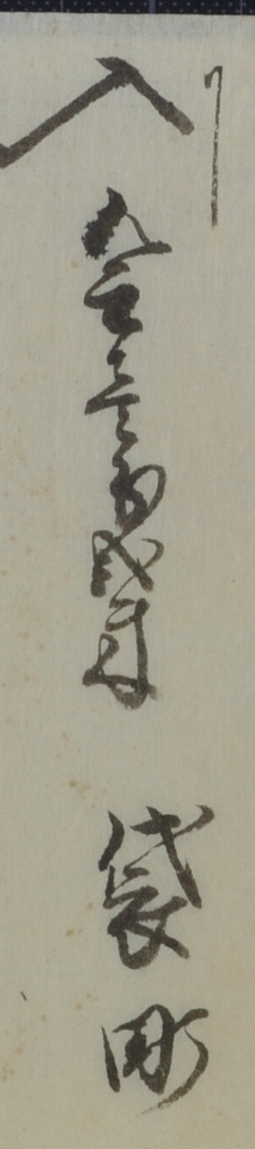入金壱分弐朱袋町
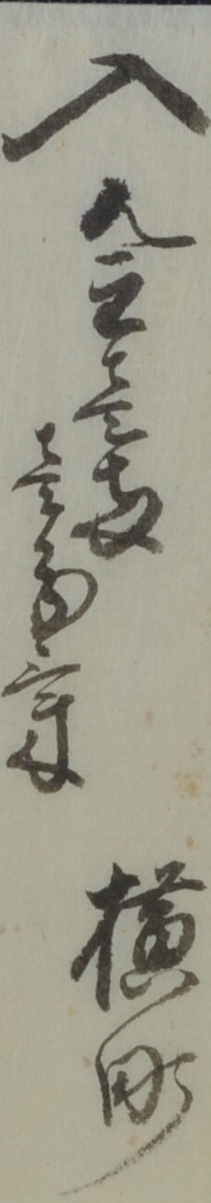入金壱両弐朱新町
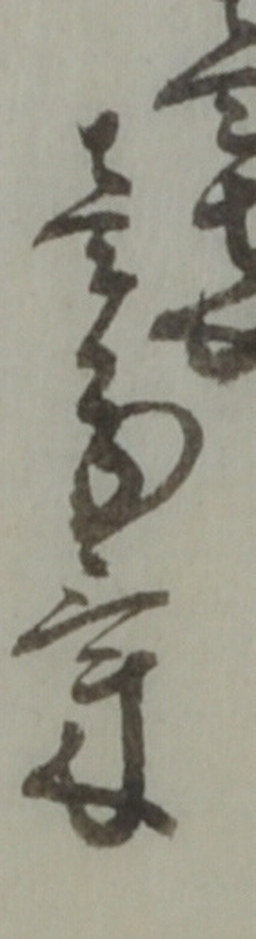壱分三朱
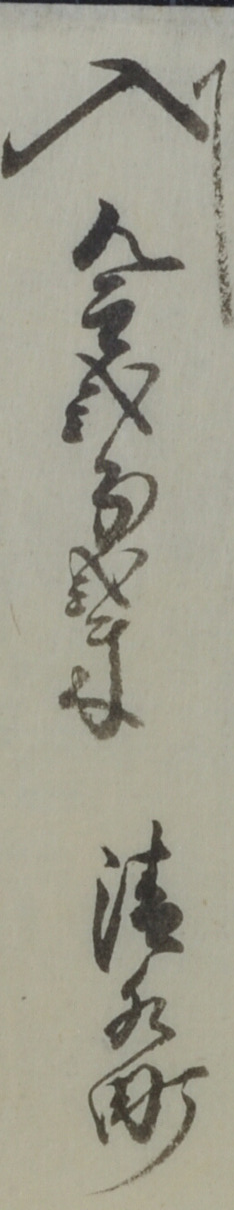入金弐分弐朱清水町
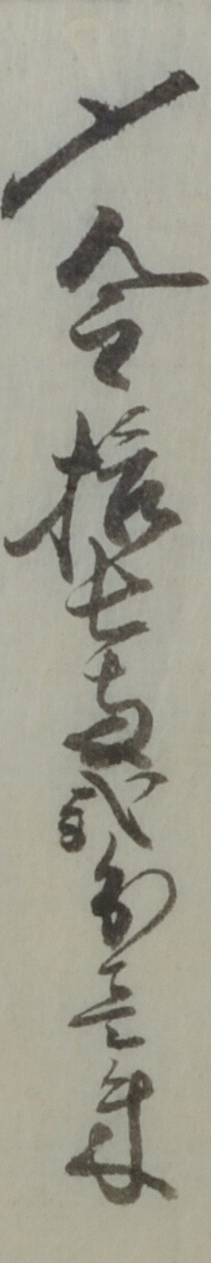〆金拾七両弐分壱朱
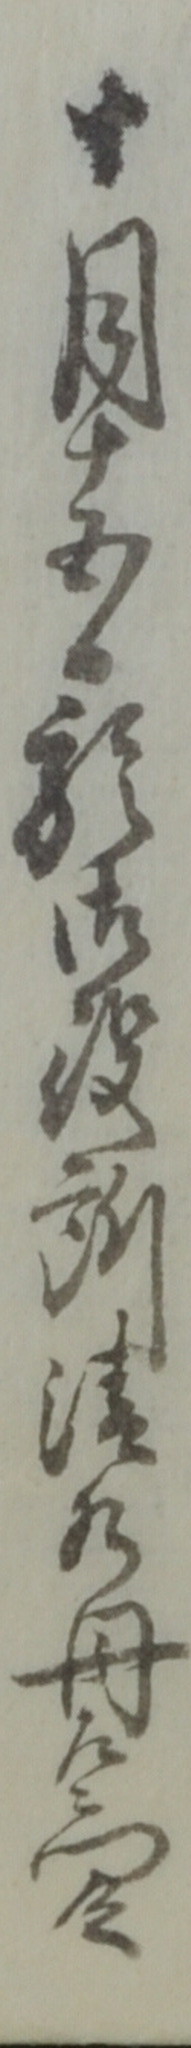十月十五日於御役所清水丹左衛門殿
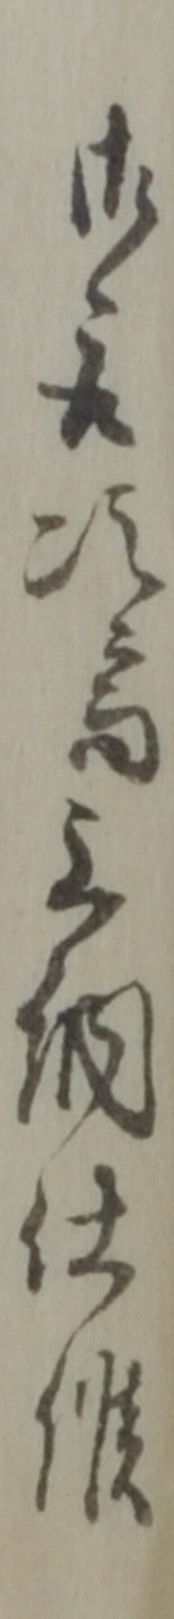御取次ニ而上納仕候

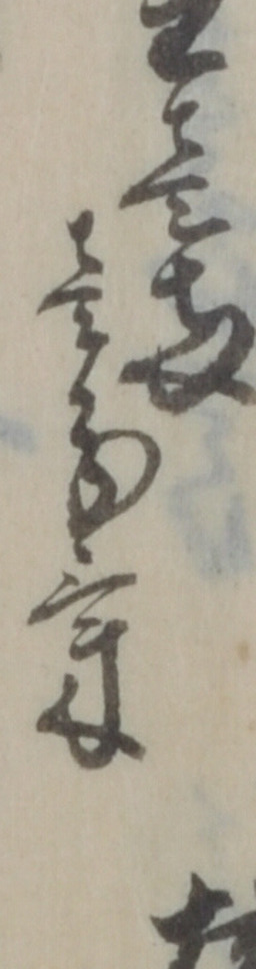壱分弐朱
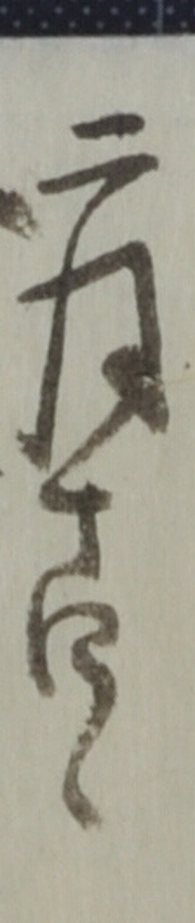二月十四日
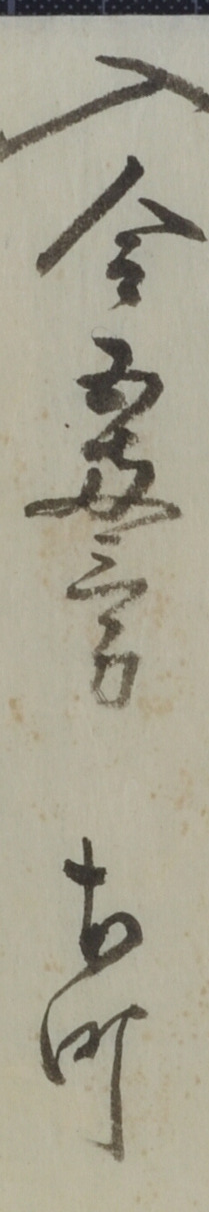入金五両三分本町
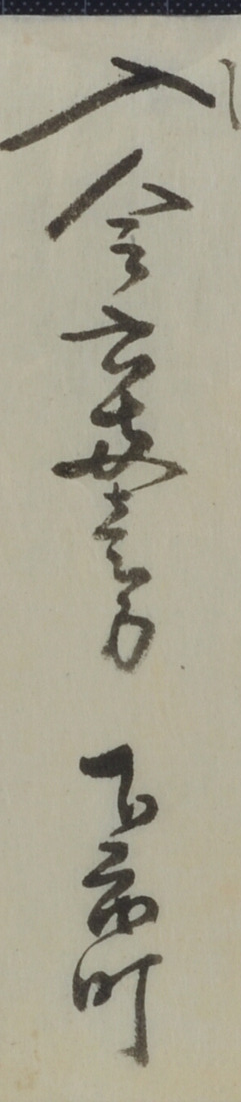入金六両壱分下茂町
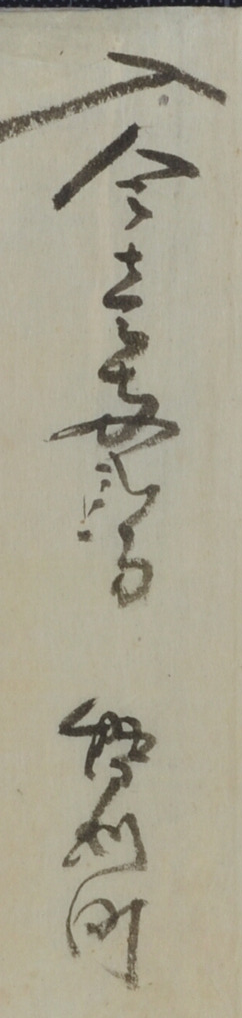入金壱両弐分勢利町
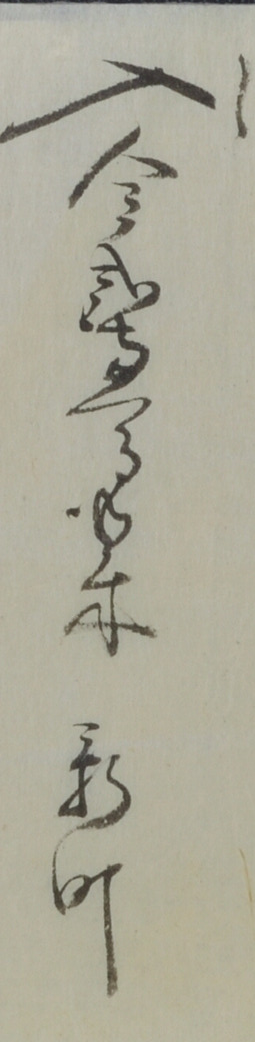入金弐両一分五朱新町
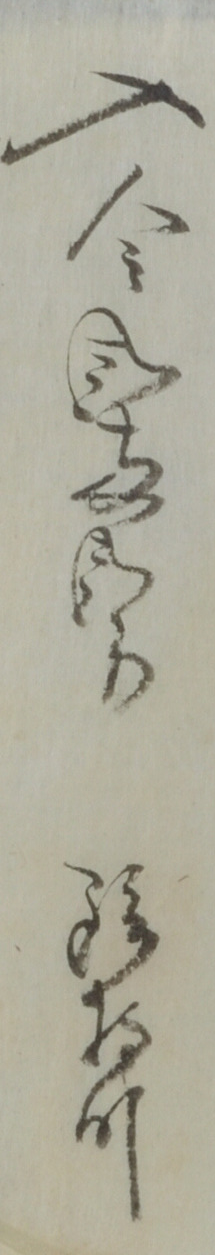入金弐両弐分鉾持町
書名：江戸御上屋鋪御類焼ニ付拾町より献金取集帳
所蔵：伊那市立高遠町図書館・合同会社AMANE
